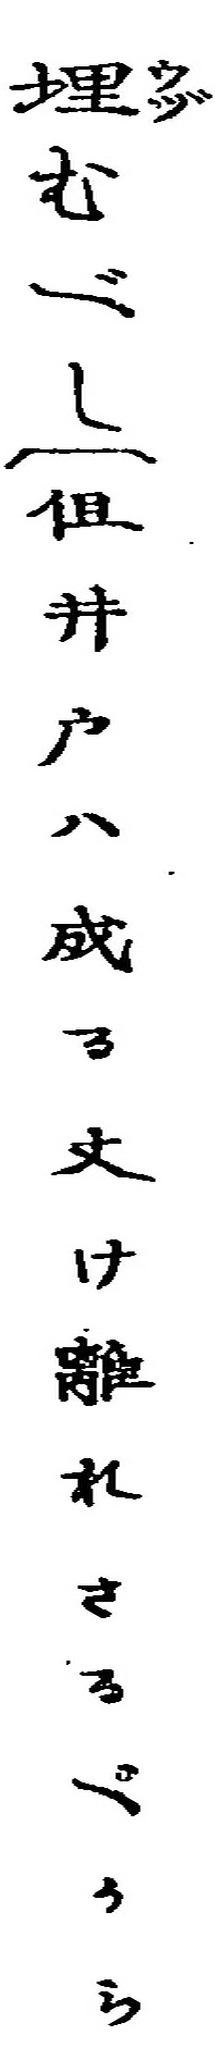埋むべし[但井戸は成る丈け離れさるべから
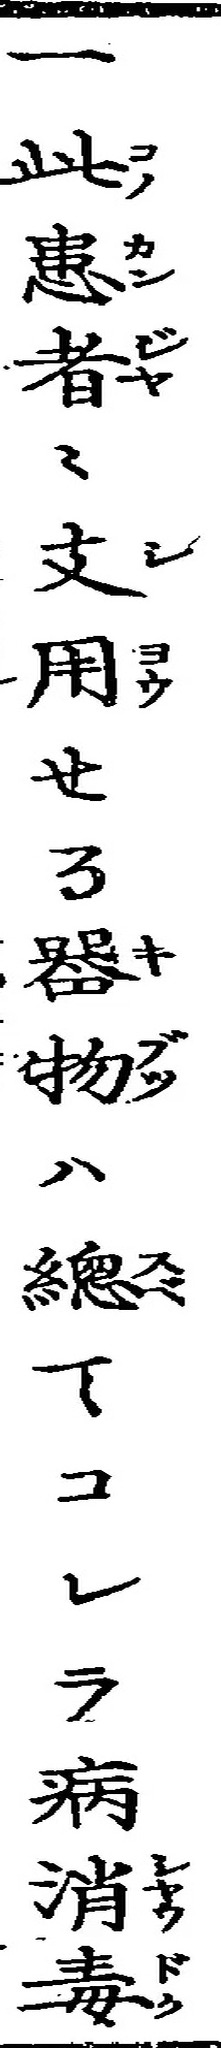一此患者に支用せる器物は総てコレラ病消毒
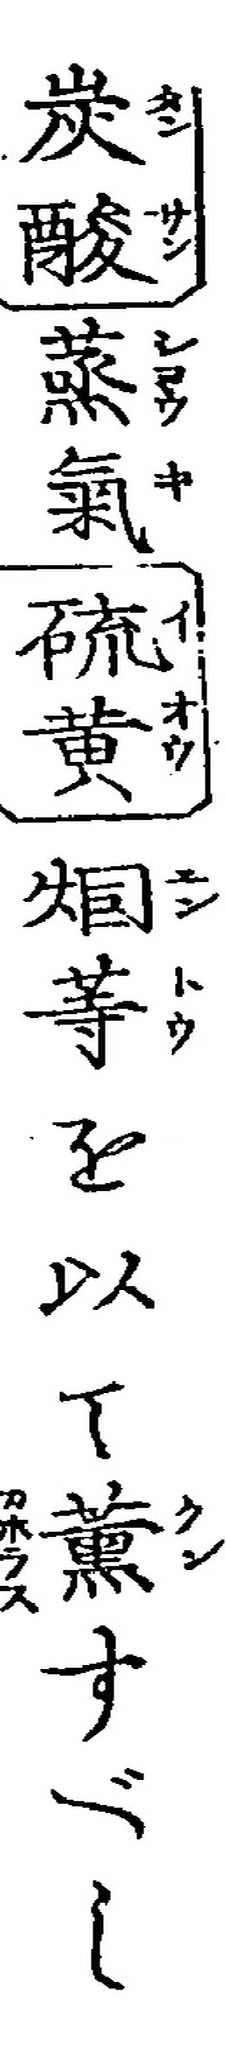炭酸」蒸気「硫黄」煙等を以て燻すべし
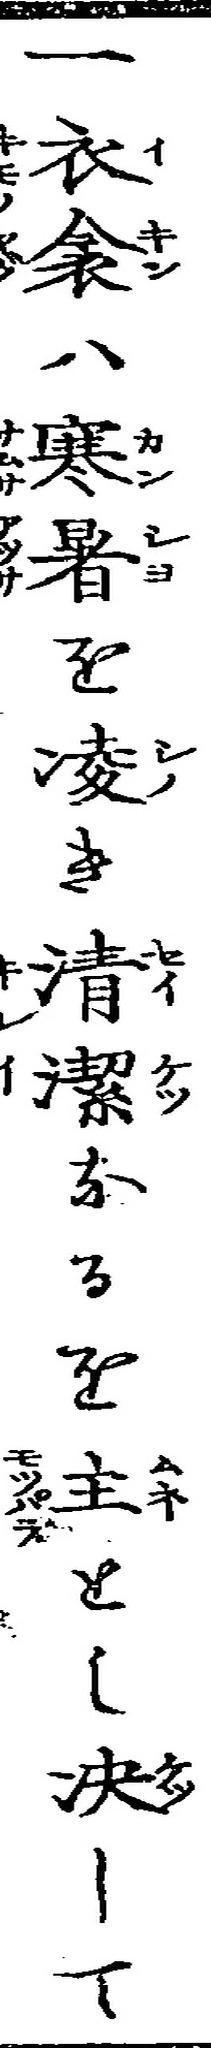一衣衾は寒暑を凌き清潔なるを主とし決して
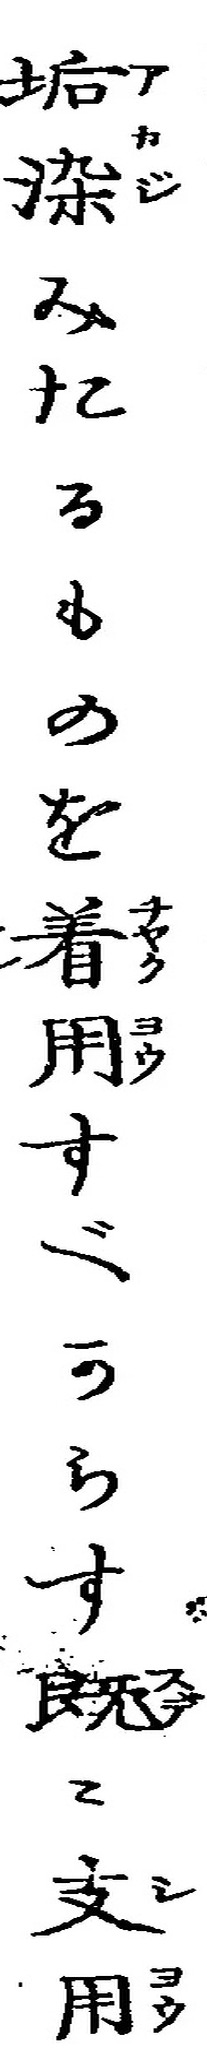垢染みたるものを着用すべからす既に支用

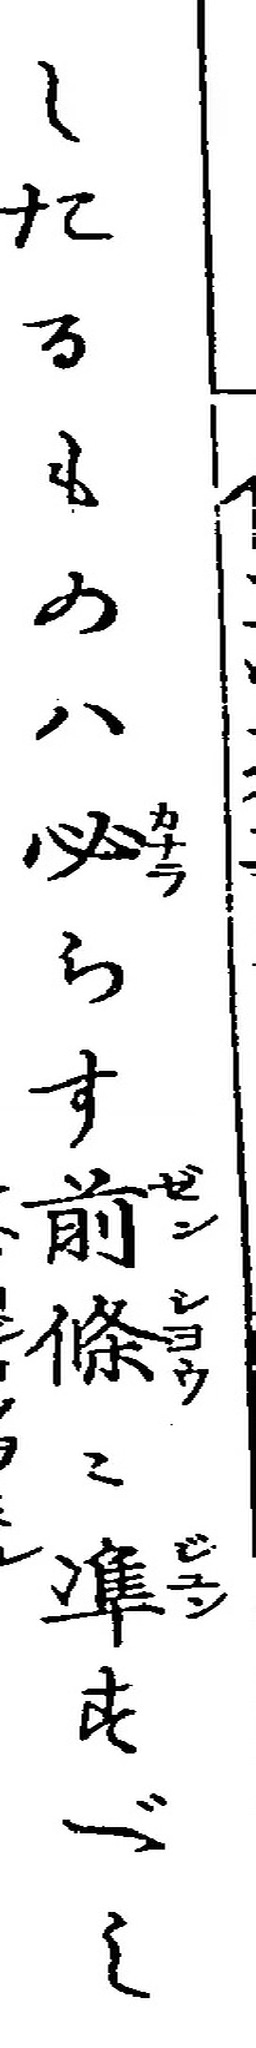したるものは必らす前条に準すべし
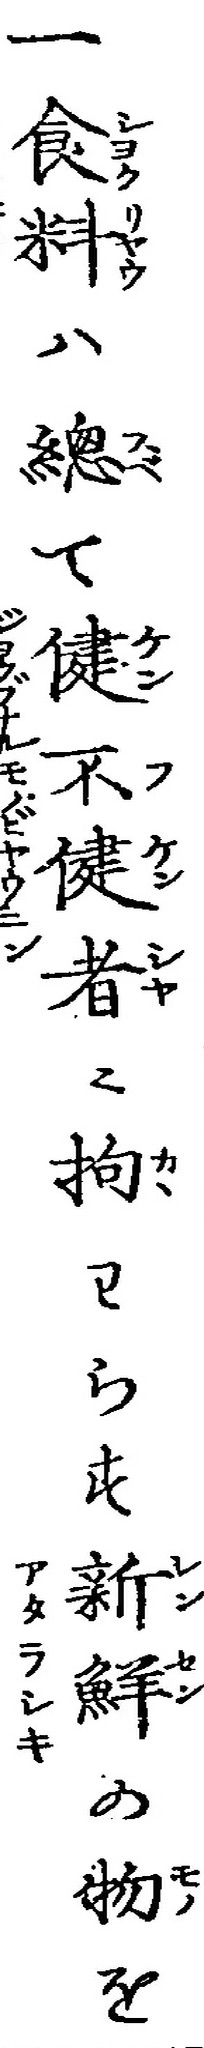一食料は総て健不健者拘わらす新鮮の物を
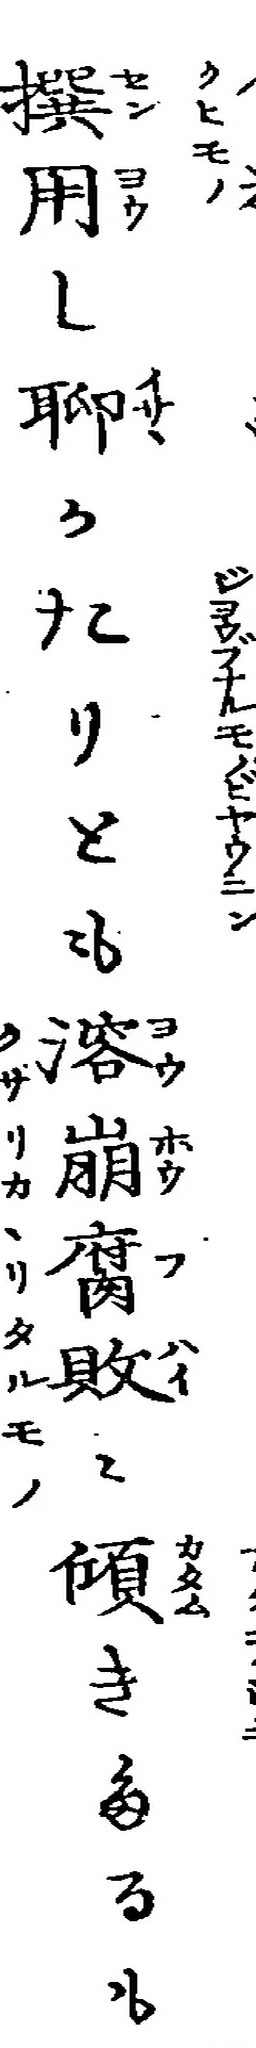撰用し聊かたりとも溶崩腐敗に傾きたるも
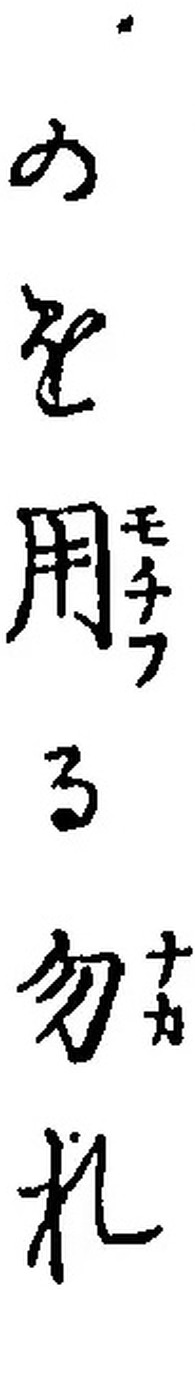のを用る勿れ
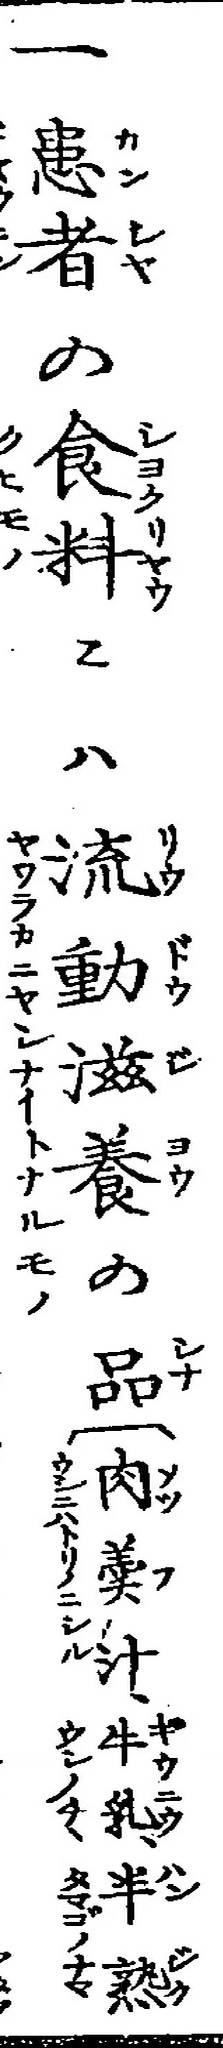一患者の食料には流動滋養の品[肉羹汁、牛乳、半熟
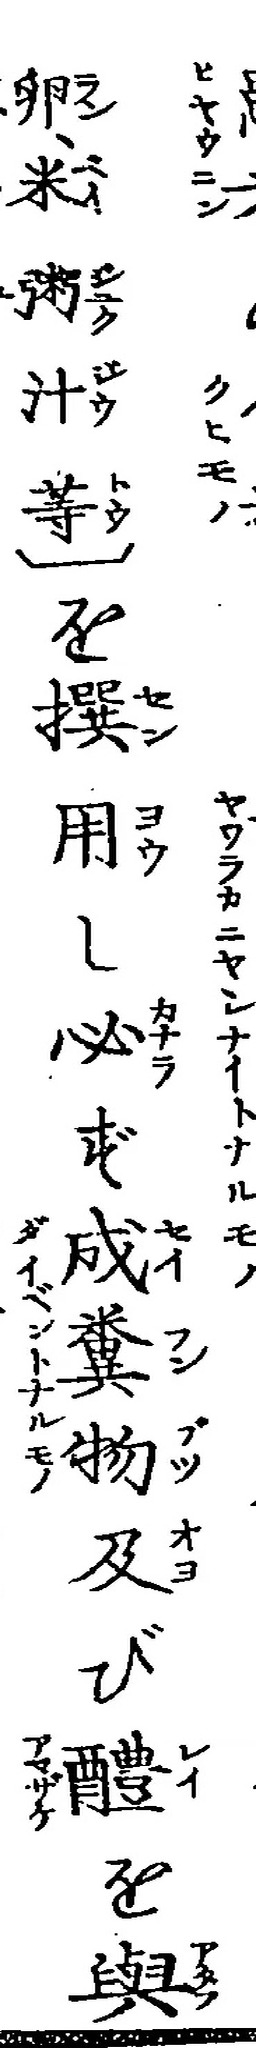卵、米粥汁等]を撰用し必ず成糞物及び醴を与
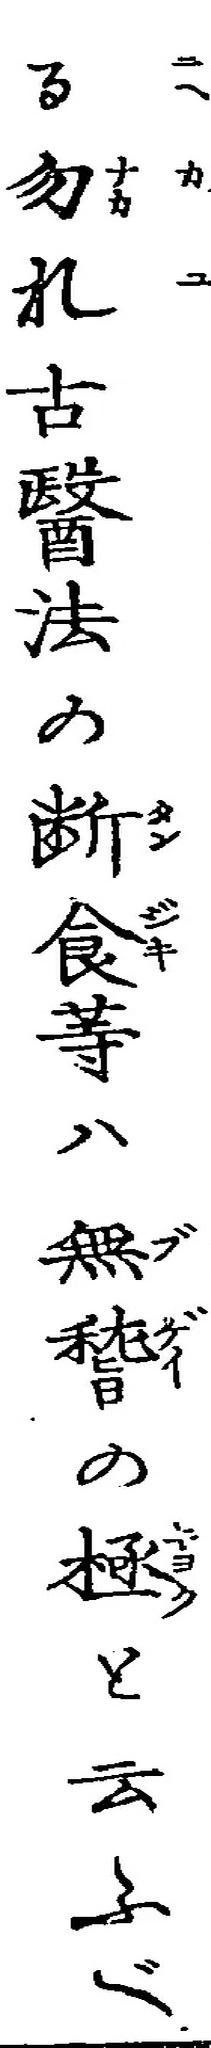る勿れ古医法の断食等は無稽の極と云ふべ
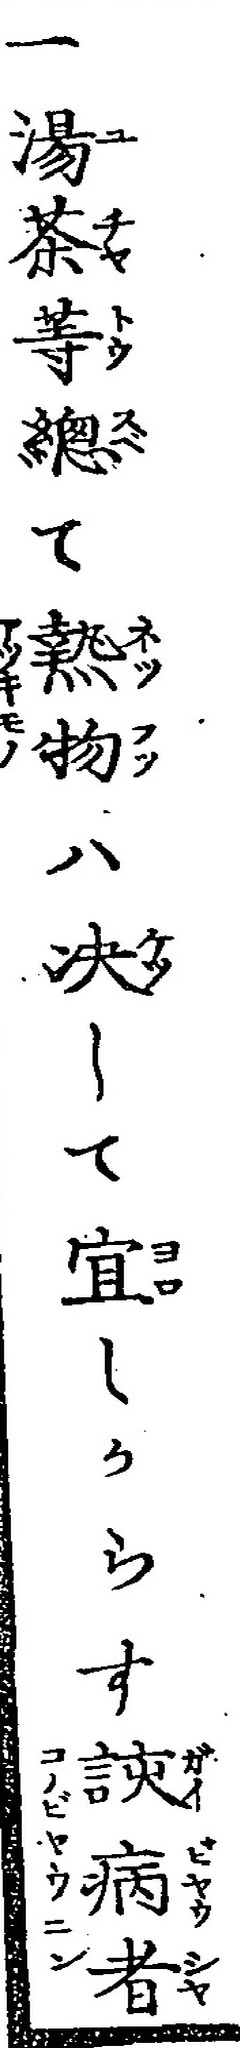一湯茶等総て熱物は決して宜しからす該病者
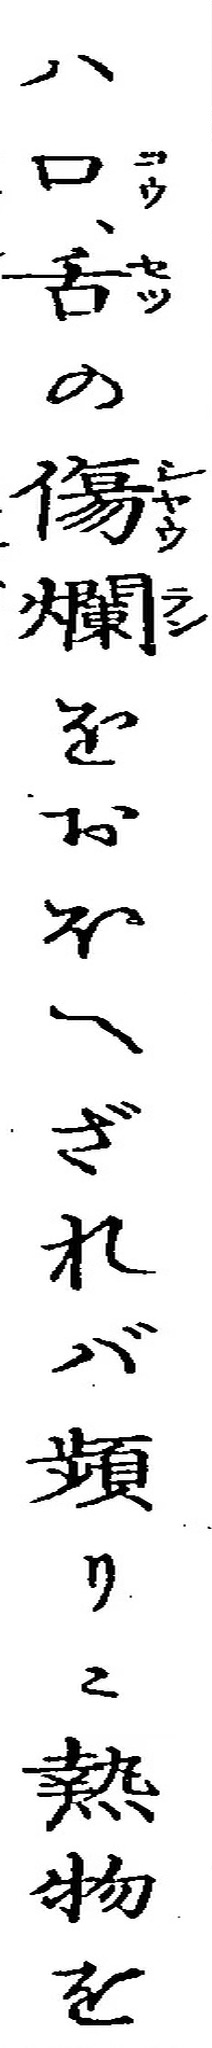は口、舌の傷爛をおほへざれば頻りに熱物を
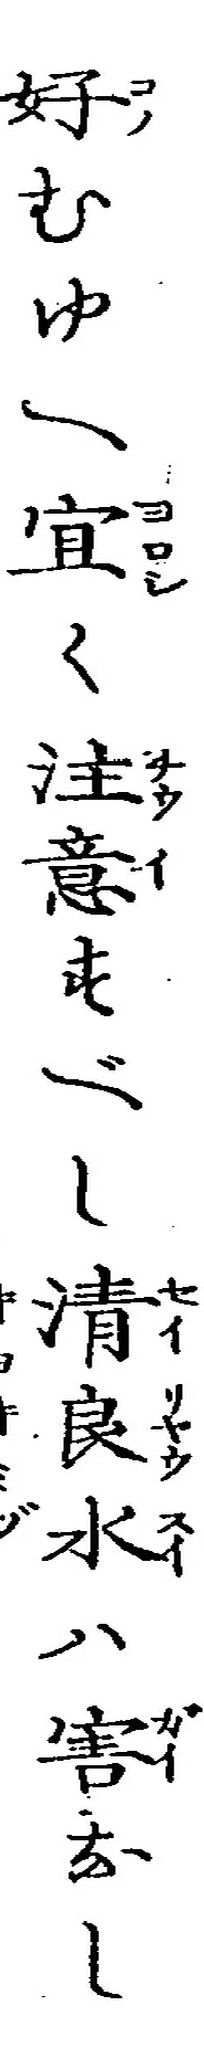好むゆへ宜く注意すべし清良水は害なし
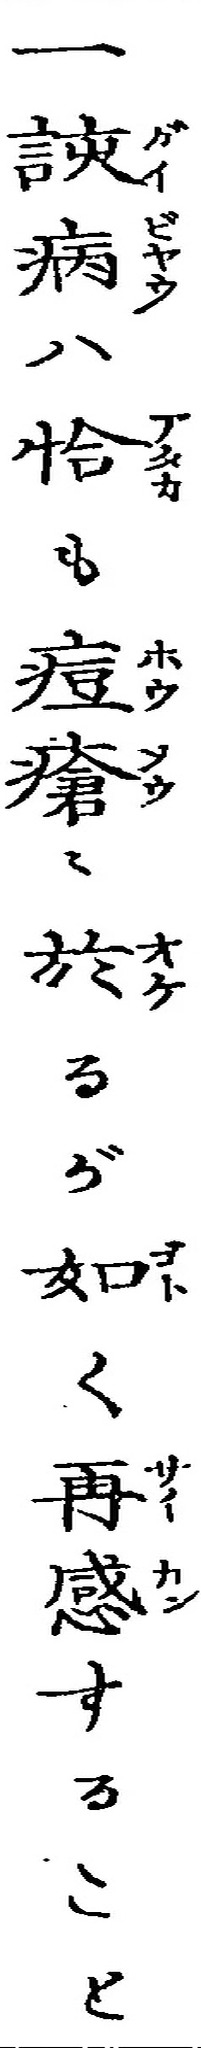一該病は恰も疱瘡に於るが如く再感すること
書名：伝染病予防法
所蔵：国立国会図書館 National Diet Library, JAPAN
